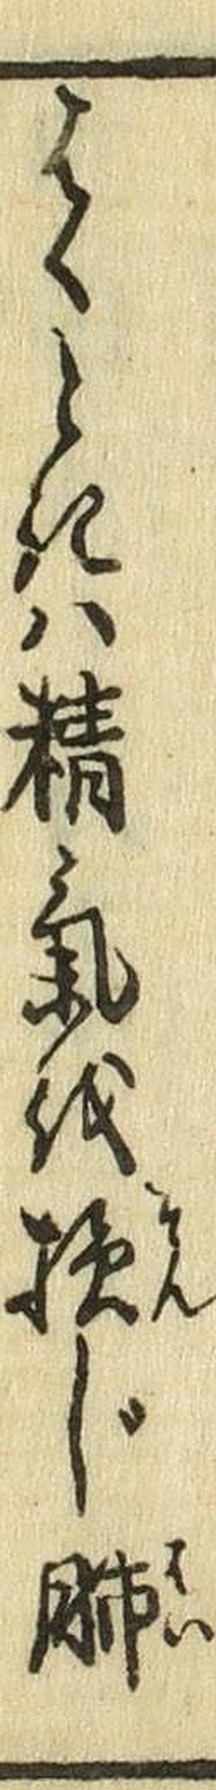はくときは精気を損じ肺
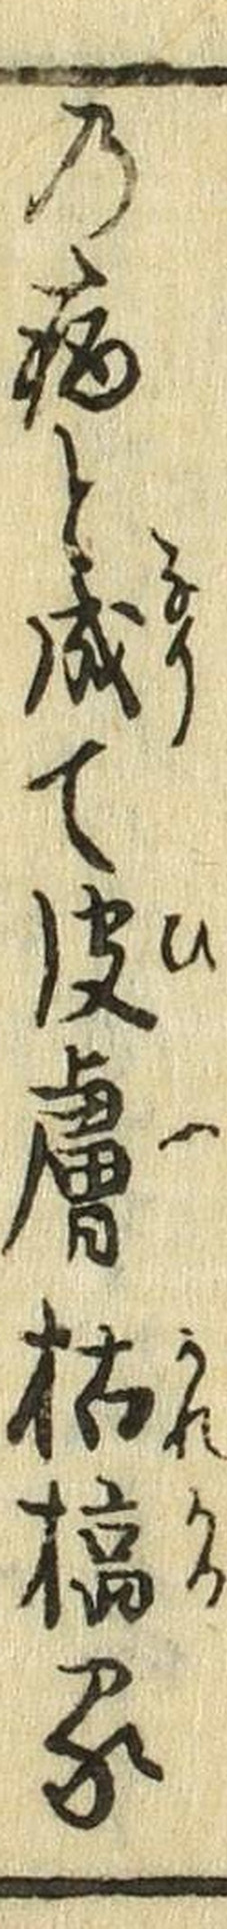の病と成て皮膚枯槁る
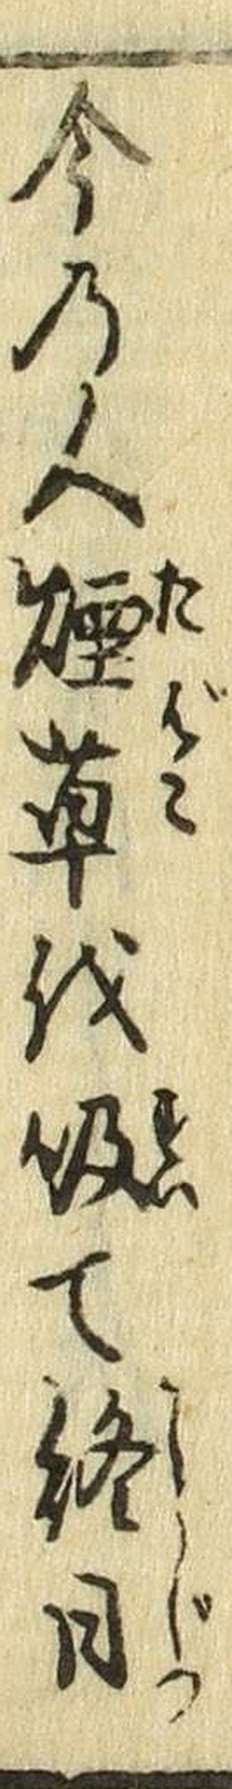今の人煙草を吸て終日
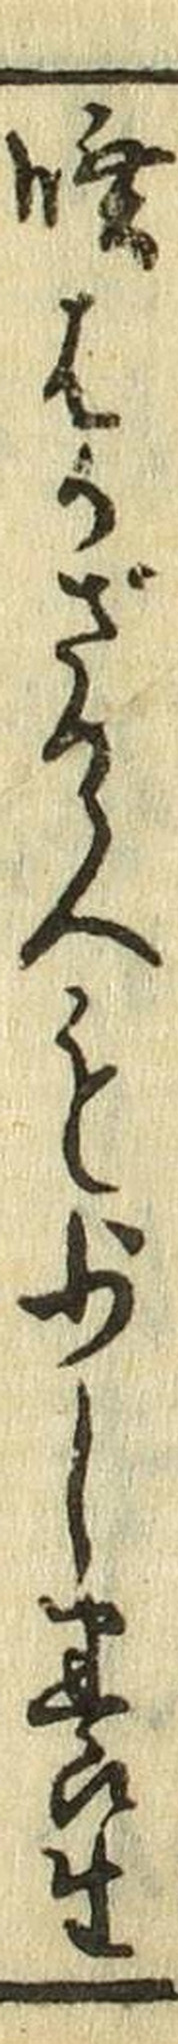唾はかざる人も少し養生
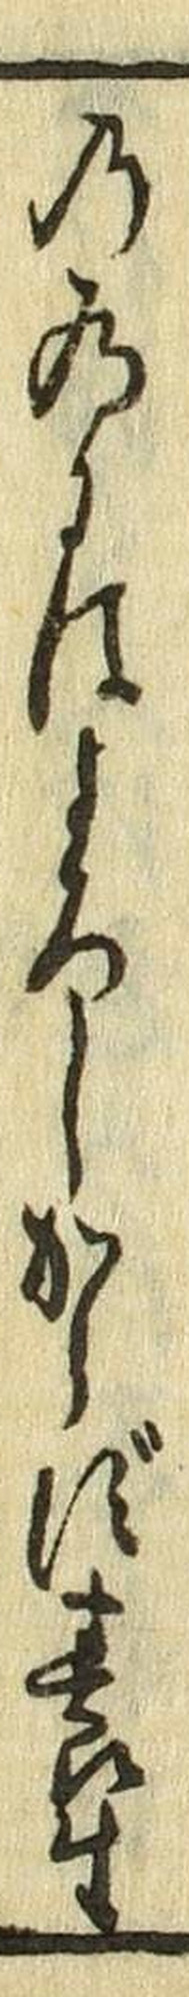の為にはよろしからず養生
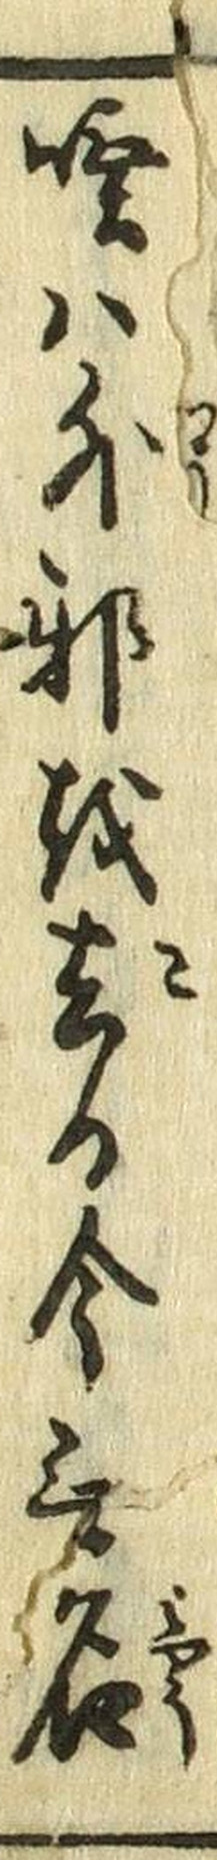唾は外邪を去る今無名
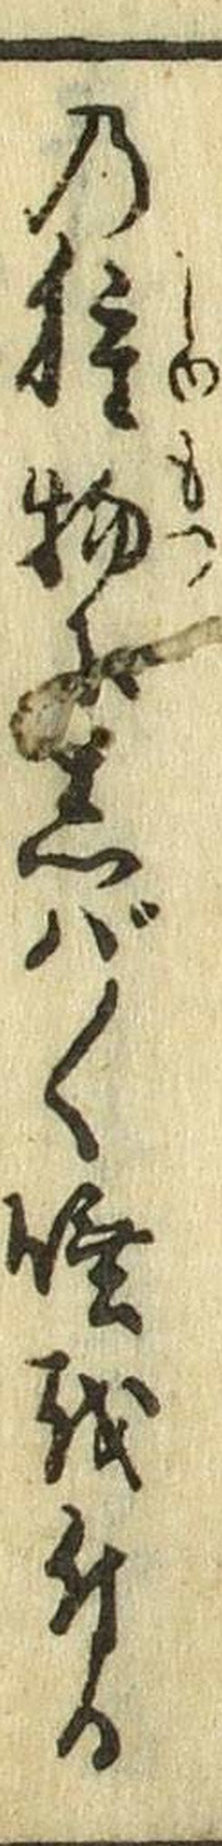の腫物にしば〳〵唾を付る
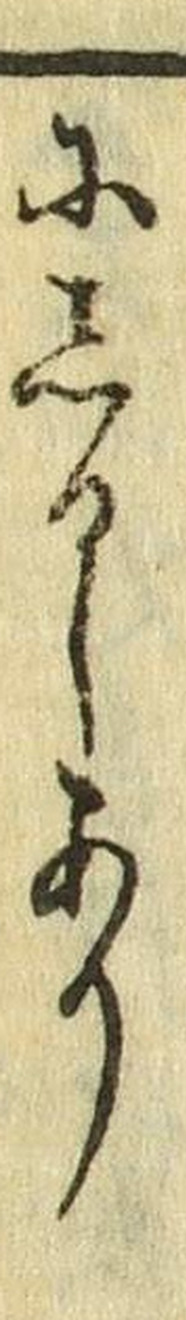にしるしあり

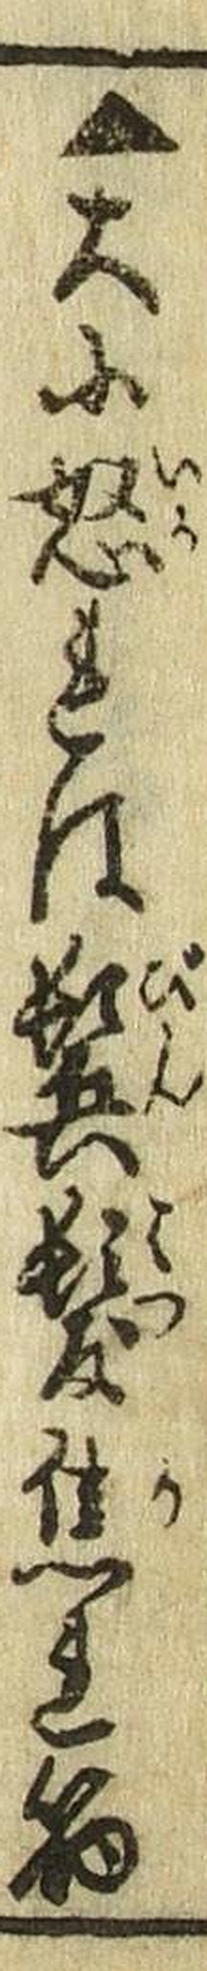▲大に怒れは鬢髪焦れ筋
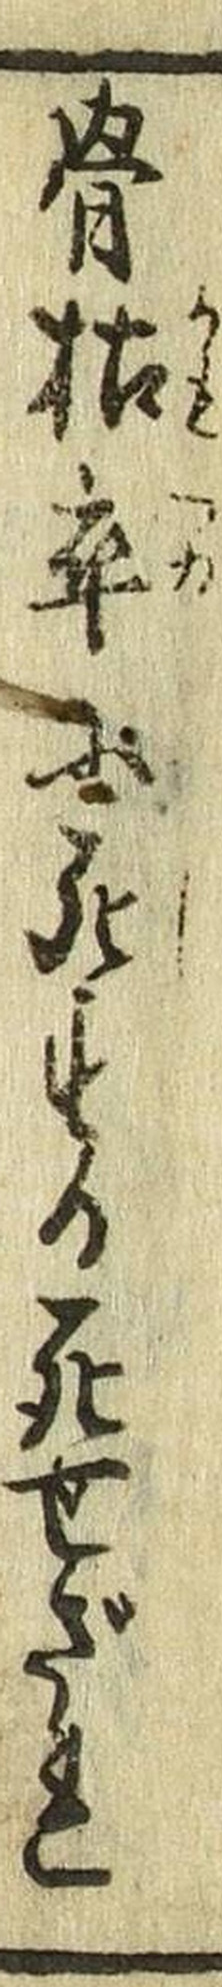骨枯卒に死する死せざれ
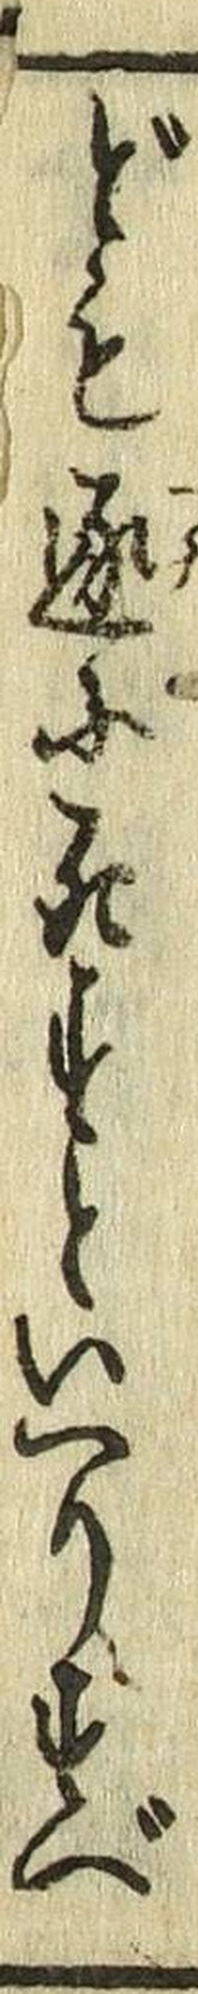ども遂に死すといへりすべ
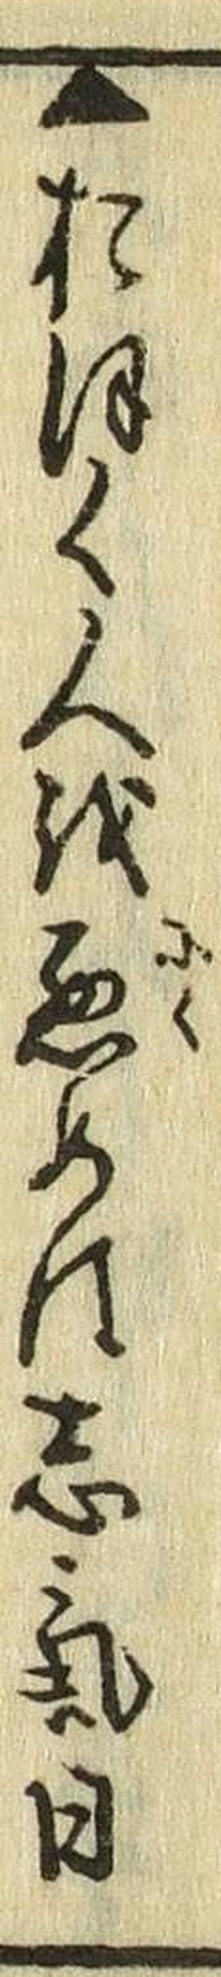▲おほく人を悪めは志気日
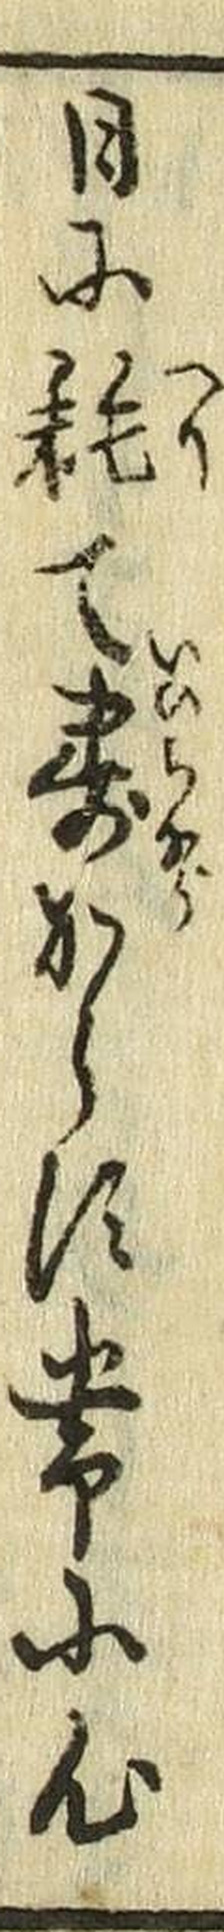日に耗て寿からす常に心
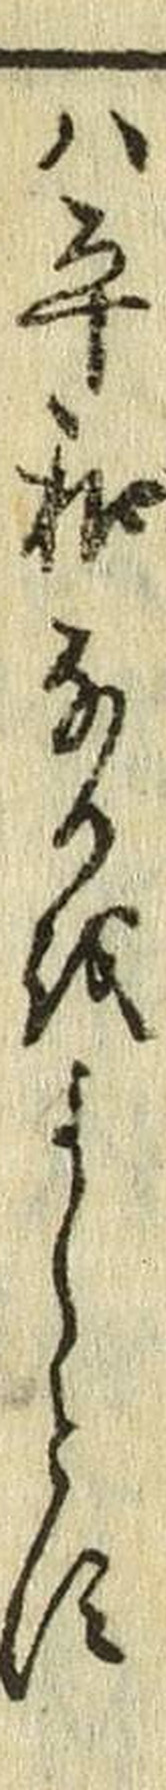は平和なるをよしとす
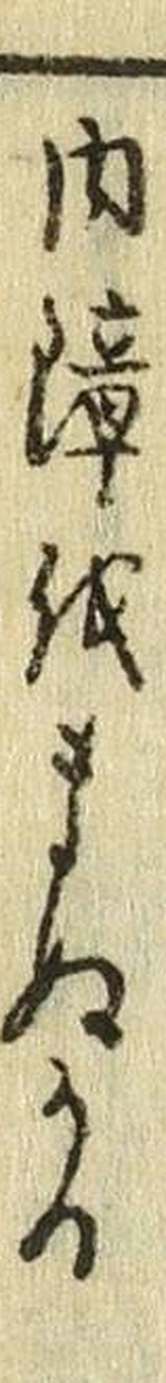内障をまぬかる
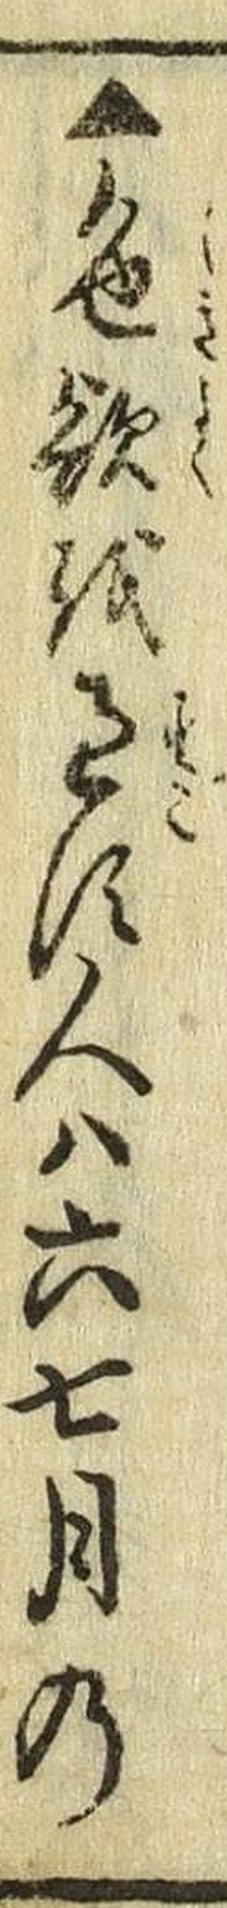▲色欲を過す人は六七月の
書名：居家養生記
